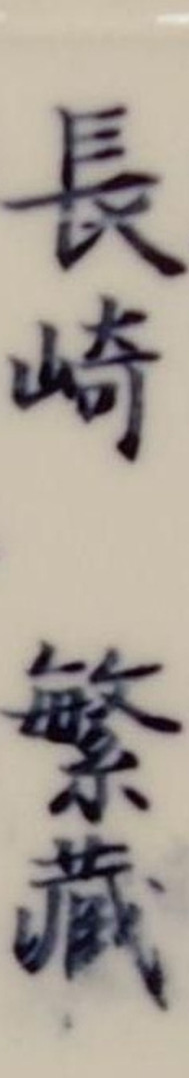長崎繁蔵
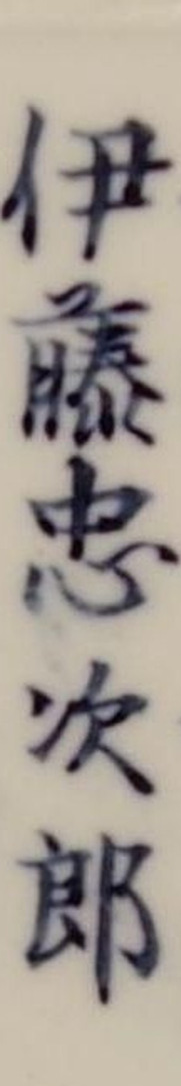伊藤忠次郎
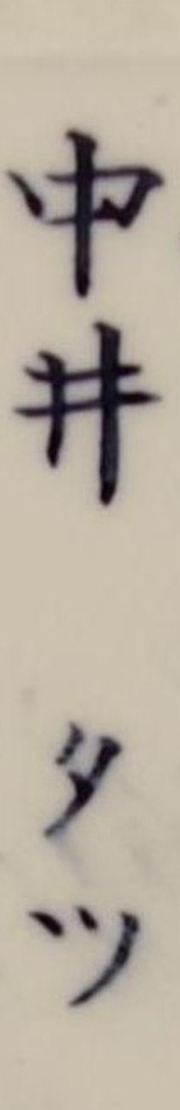中井タツ
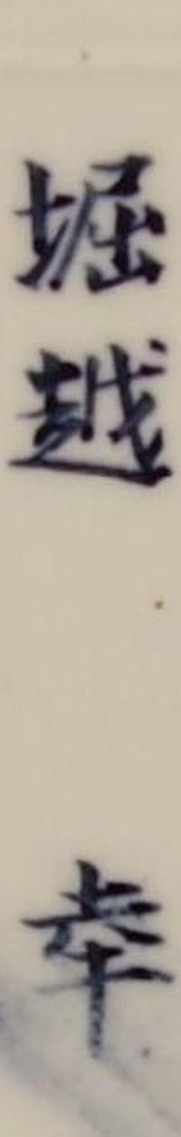堀越幸
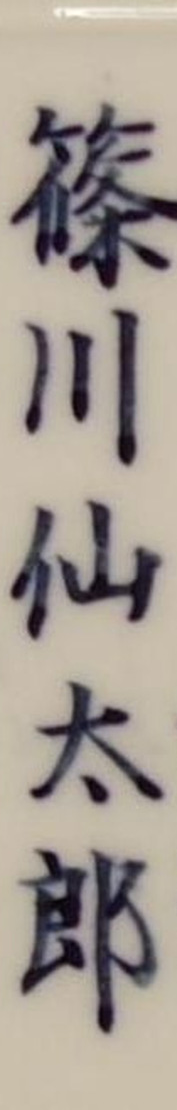篠川仙太郎
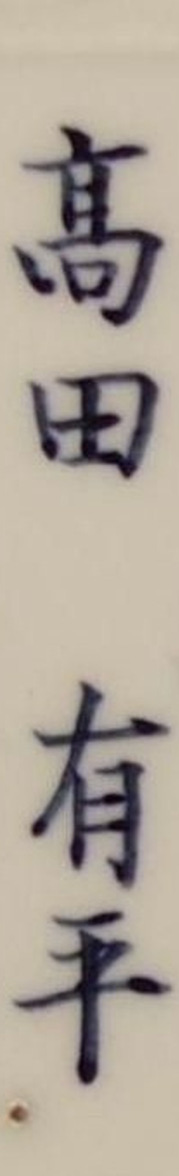高田有平
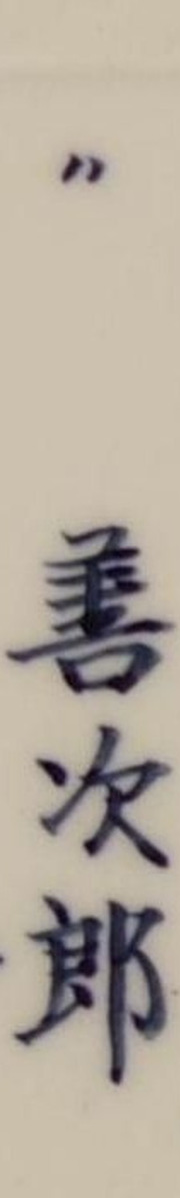善次郎
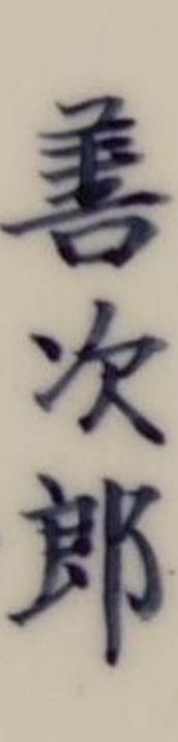善次郎
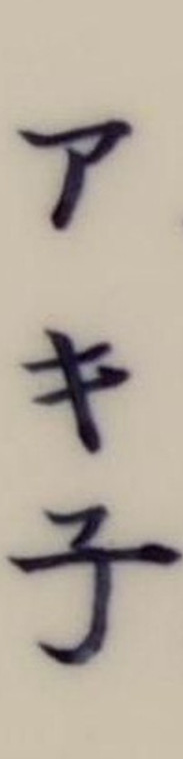アキ子
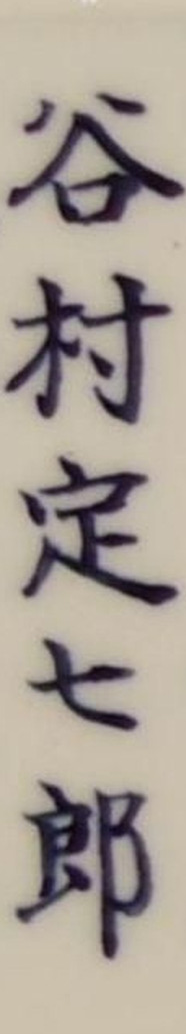谷村定七郎
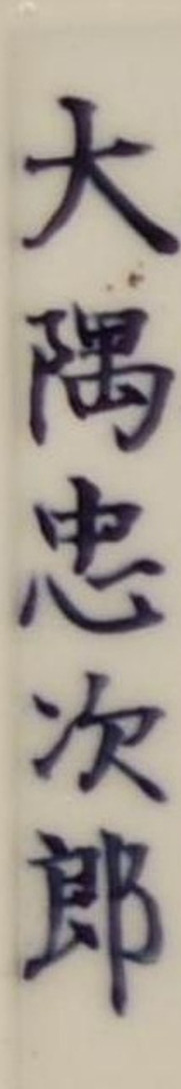大隅忠次郎

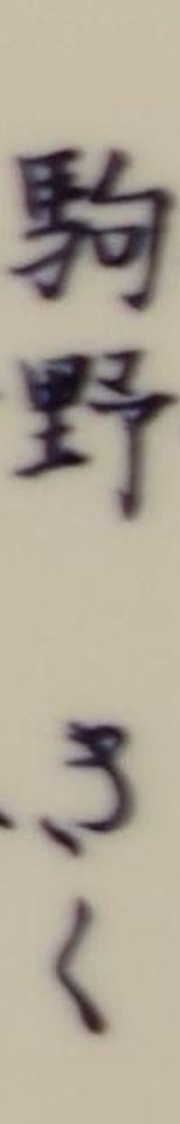駒野きく
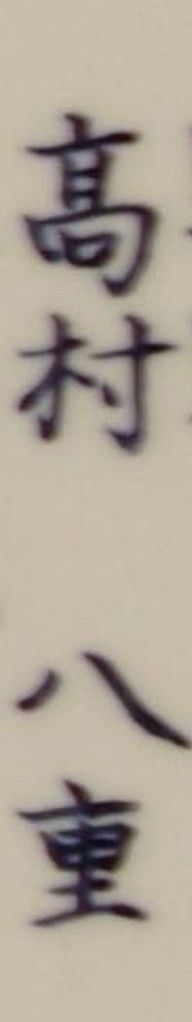高村八重
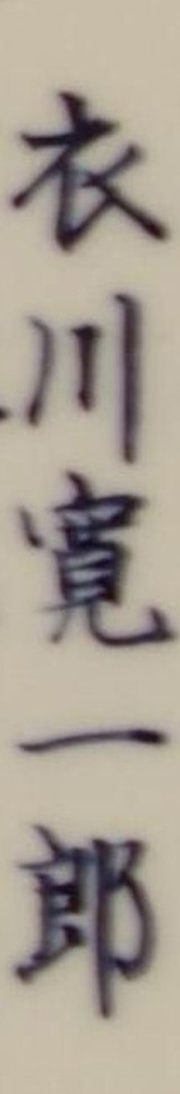衣川寛一郎
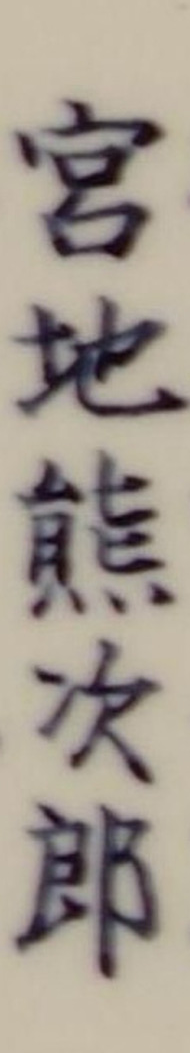宮地熊次郎
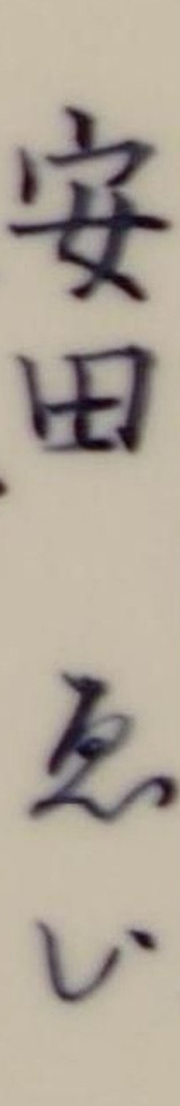安田ゑい
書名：M~S
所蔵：高野山金剛峯寺
